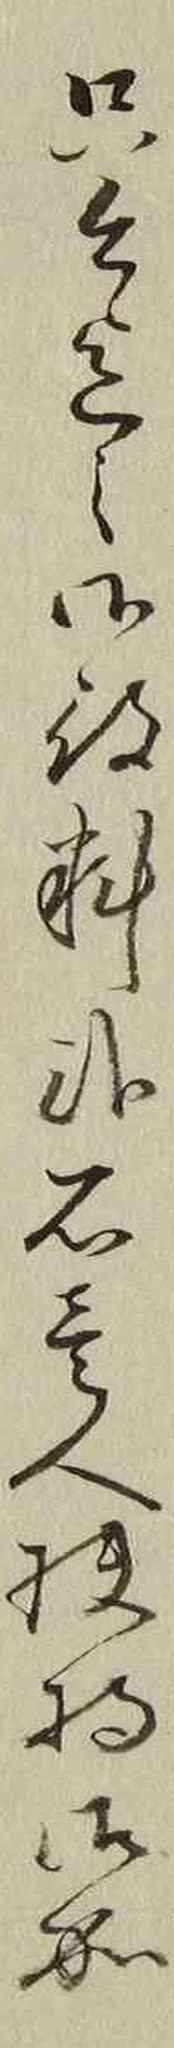只今迄之御役料弐石壱人扶持御加
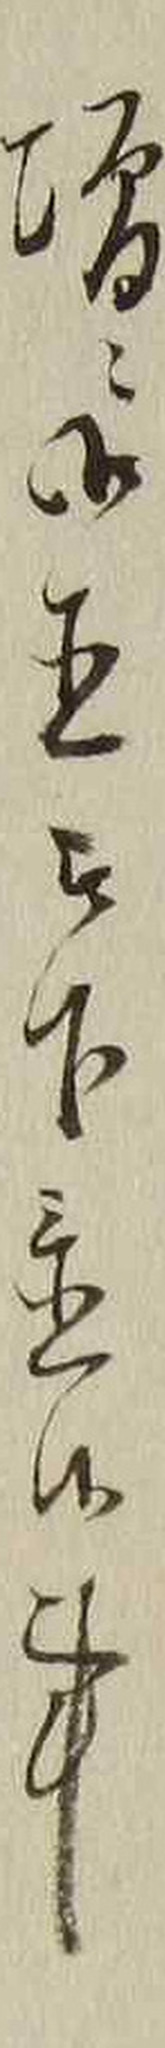増ニ御直被下置候事
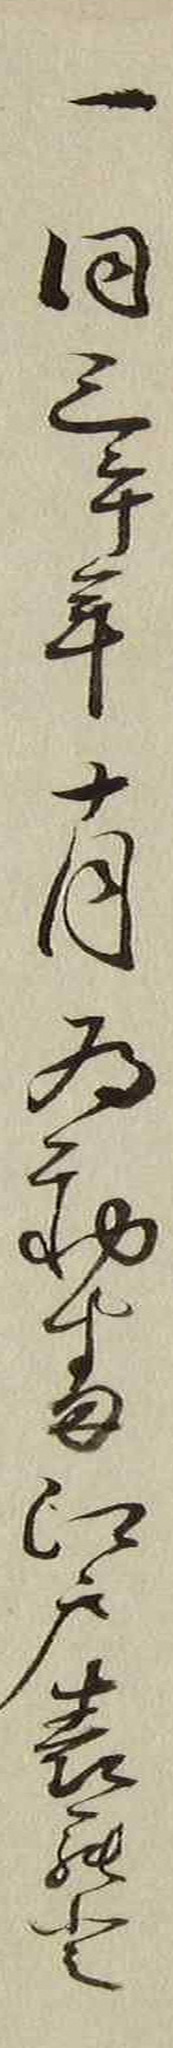一同三午年十月為勤番江戸表罷登
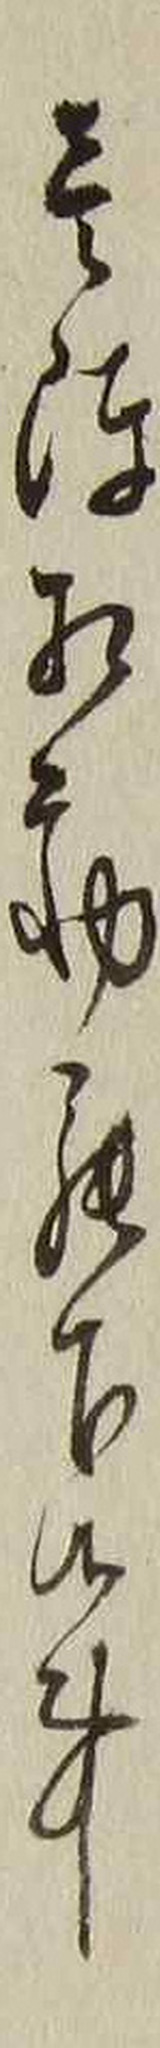壱陣相勤罷下候事
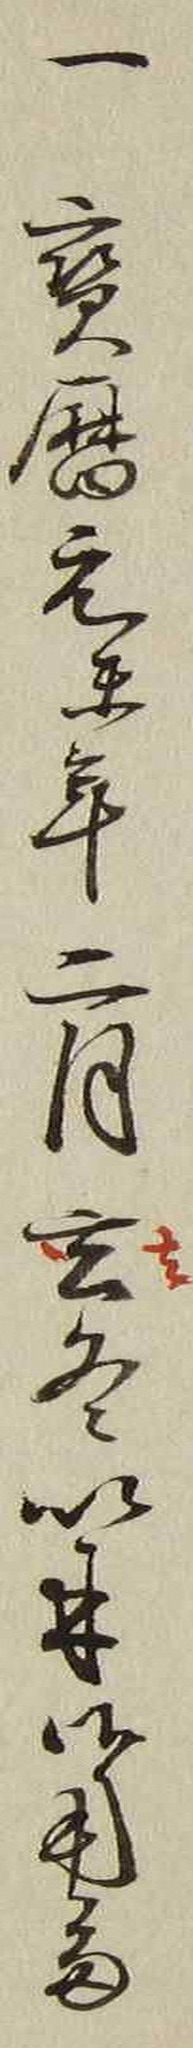一宝暦元未年二月玄冬以来御用多
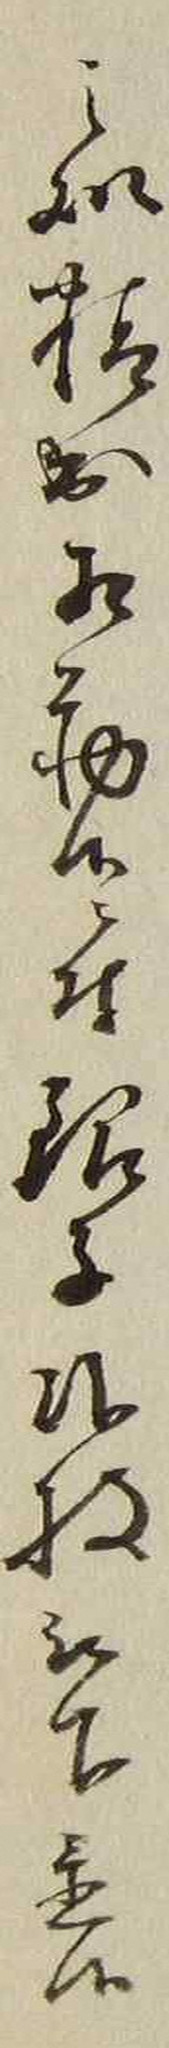之処精出相勤候ニ付銀子弐枚被下置候
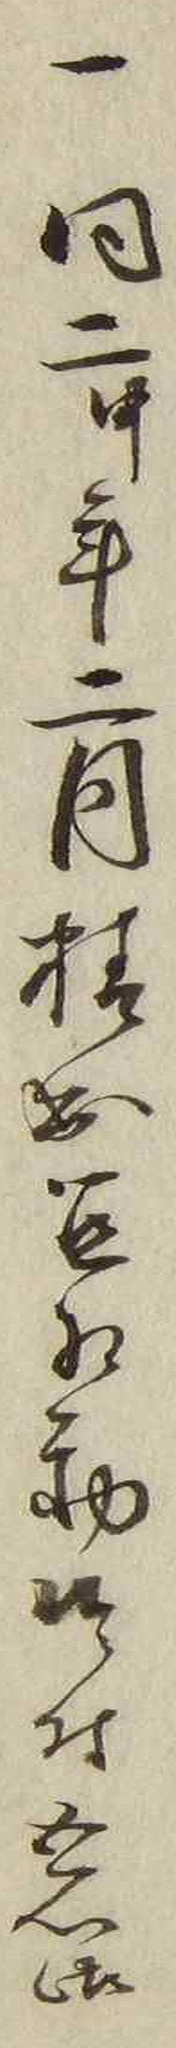一同二申年二月精出宜相勤候ニ付五石御

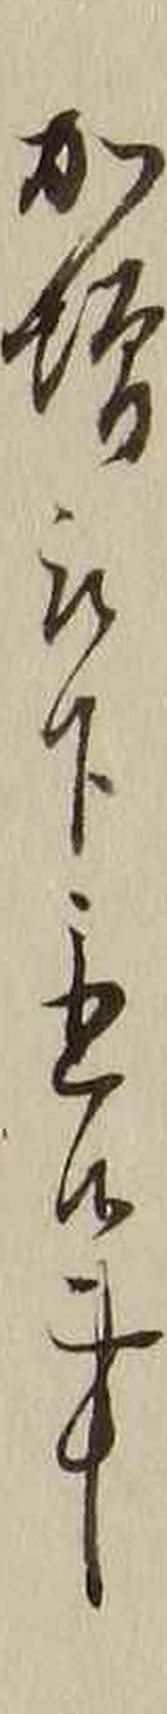加増被下置候事
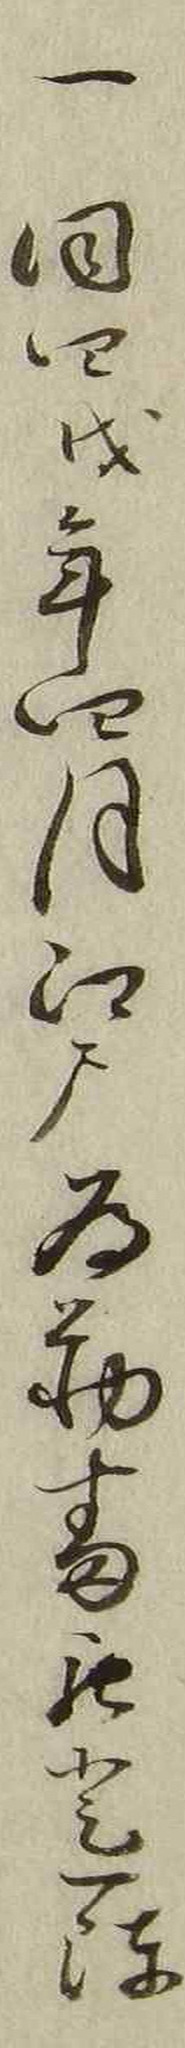一同四戌年四月江戸為勤番罷登一陣
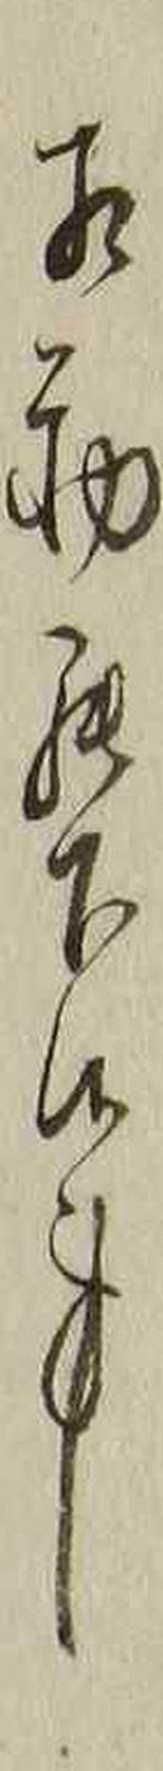相勤罷下候事
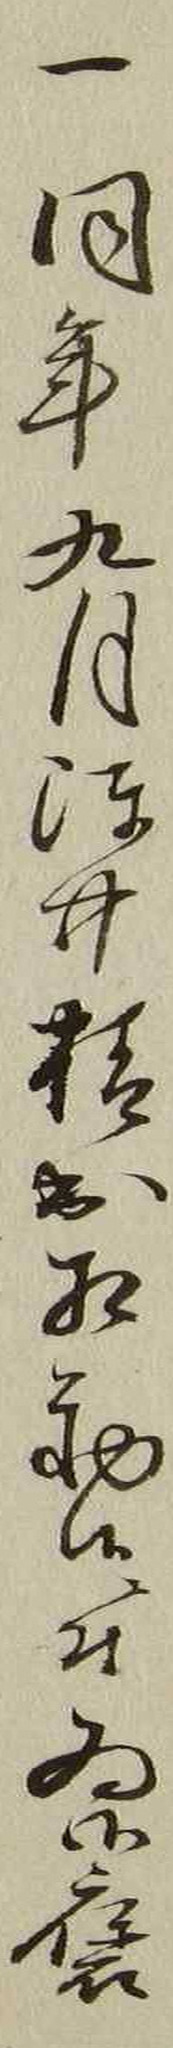一同年九月陣中精出相勤ニ付為御褒
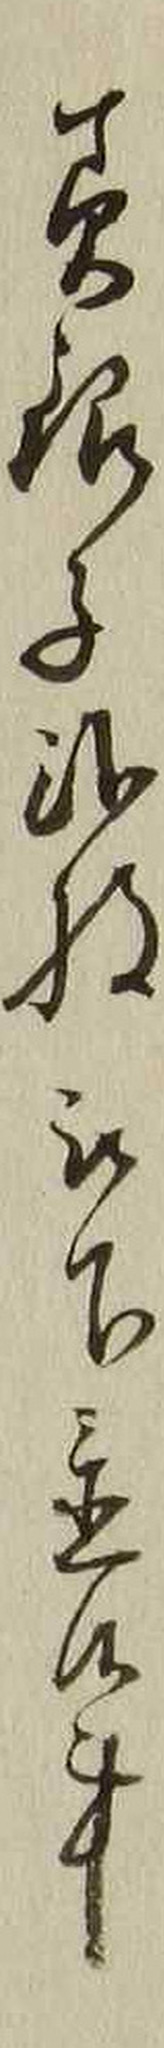美銀子弐枚被下置候事
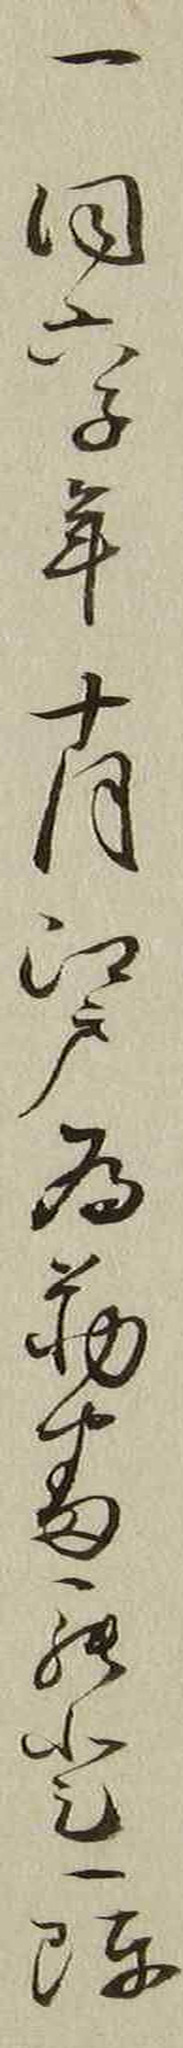一同六子年十月江戸為勤番罷登一陣
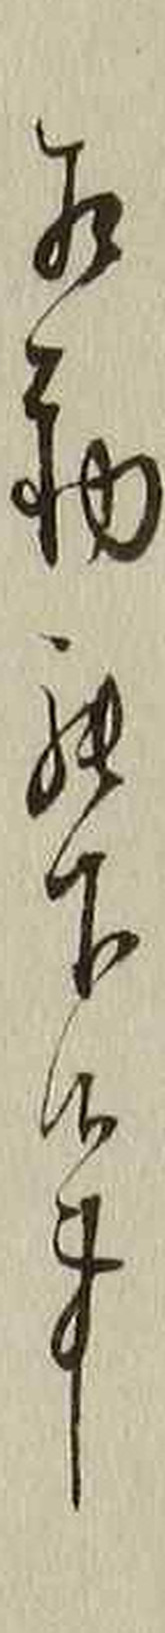相勤罷下候事
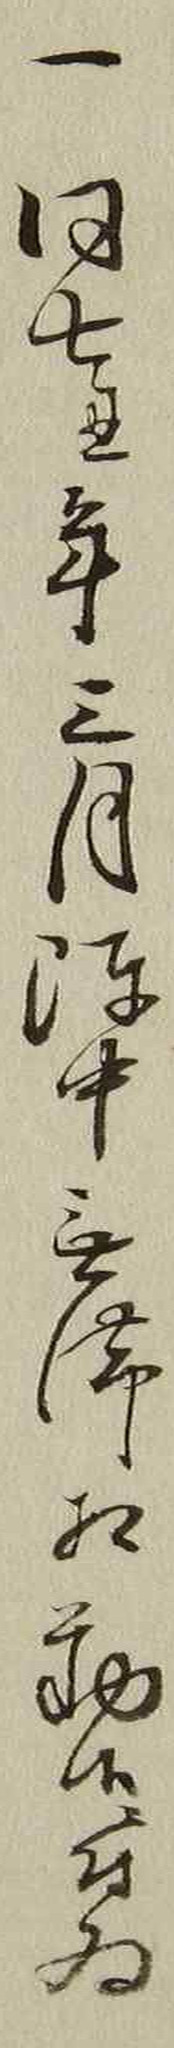一同七丑年三月陣中無滞相勤候ニ付為
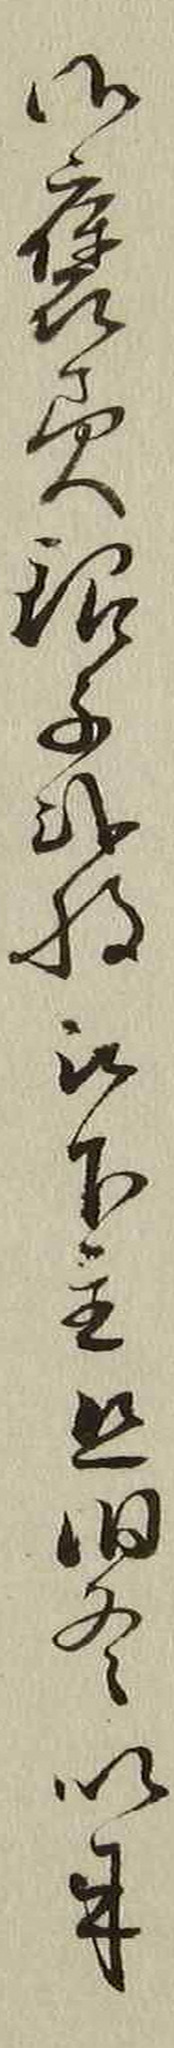御褒美銀子弐枚被下置且旧冬以来
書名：諸士系譜　巻之129　た之部5
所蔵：会津若松市立会津図書館
